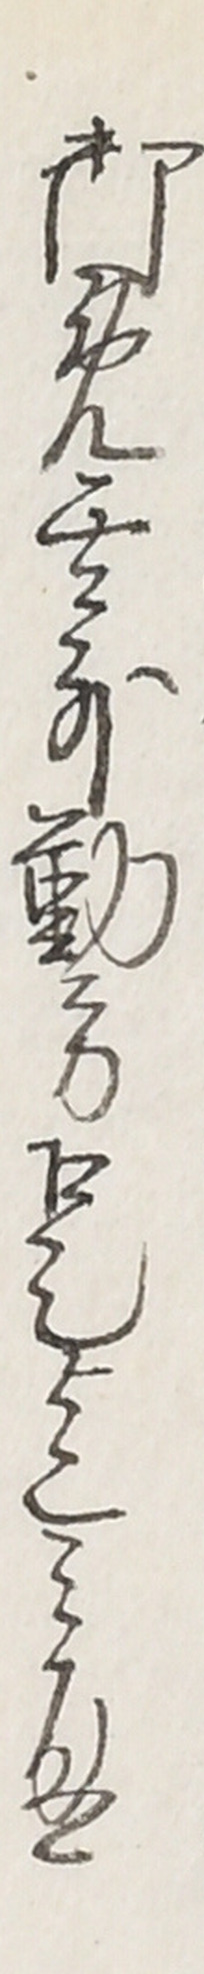御免其外勤方是迄之通
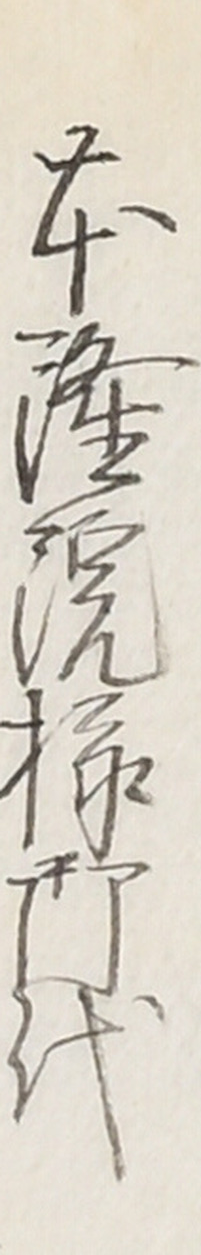本隆院様御代
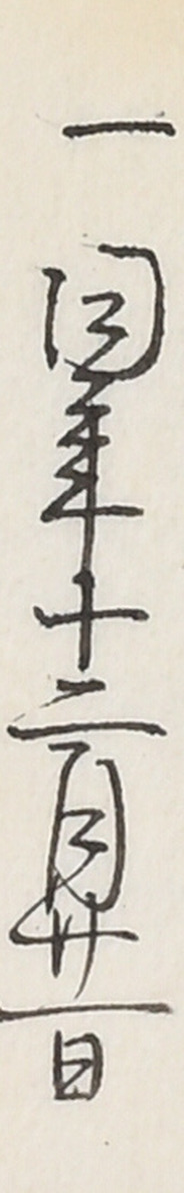一同年十二月廿一日
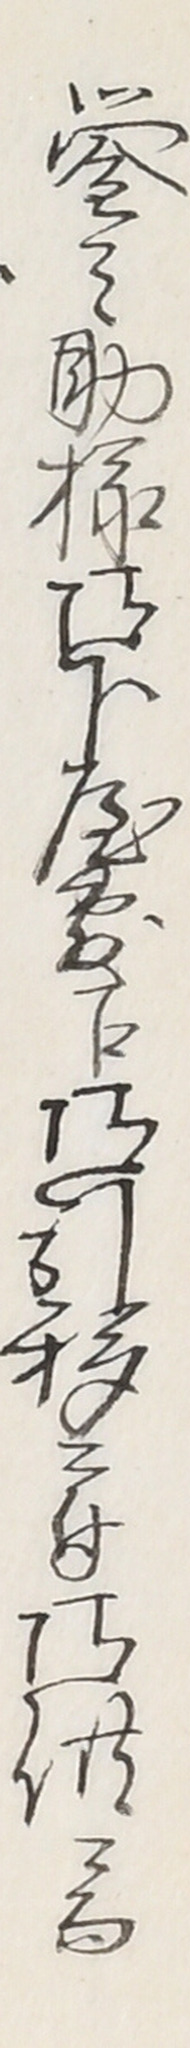鎣之助様御下屋敷江御引移ニ付御供ニ而
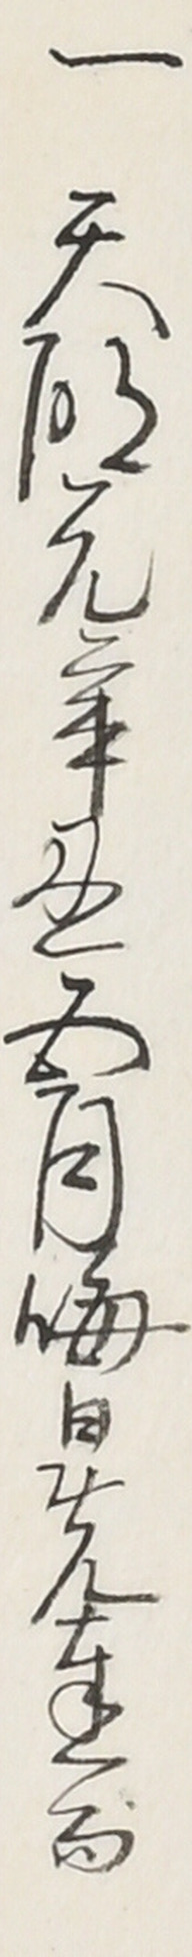一天明元辛丑五月晦日先達而
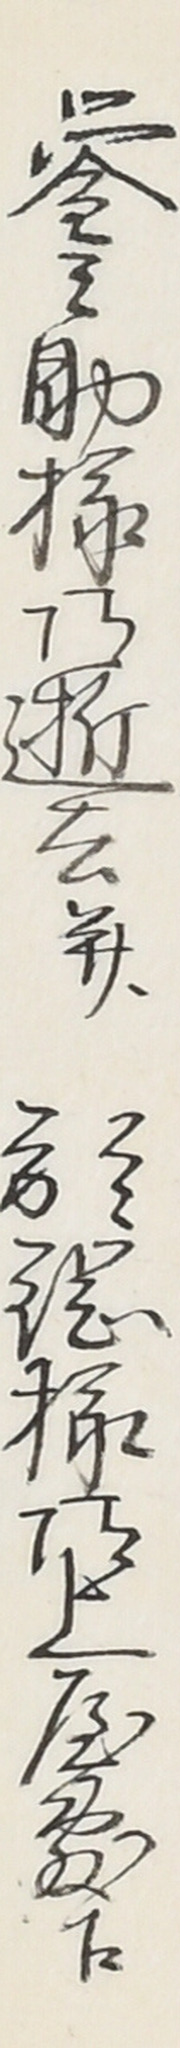鎣之助様御逝去并於鋼様御上屋敷
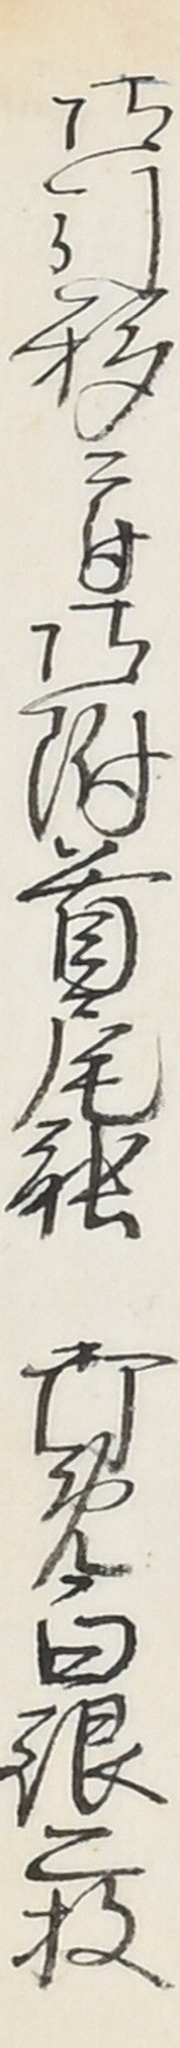御引移ニ付御附首尾能御免白銀二枚
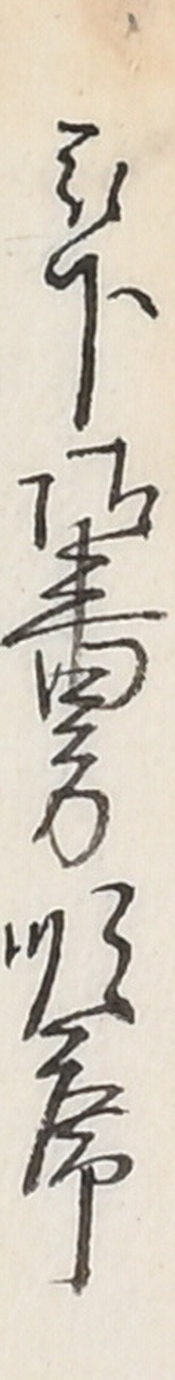被下御番方順席
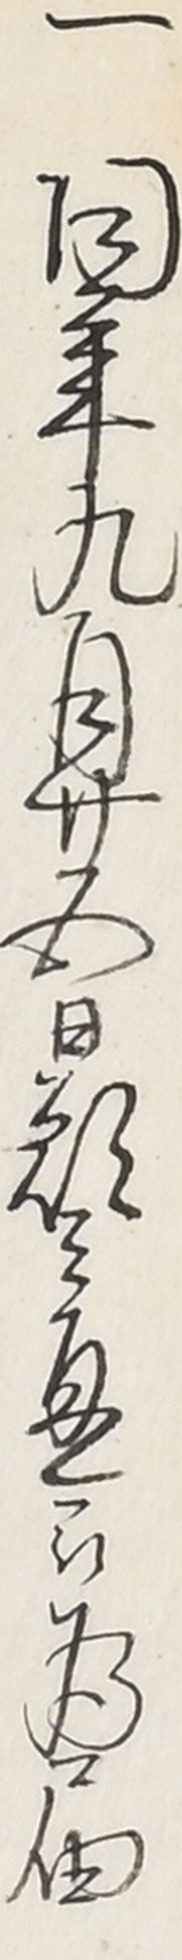一同年九月廿五日願之通被為届
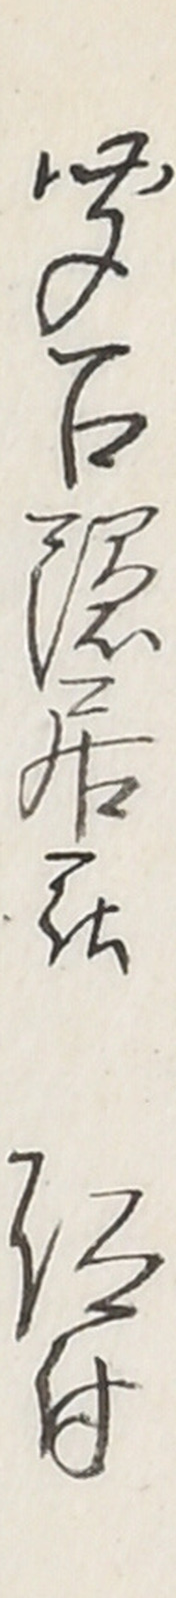聞召隠居被仰付
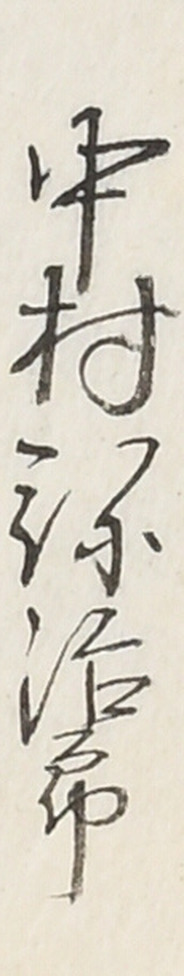中村弥治郎
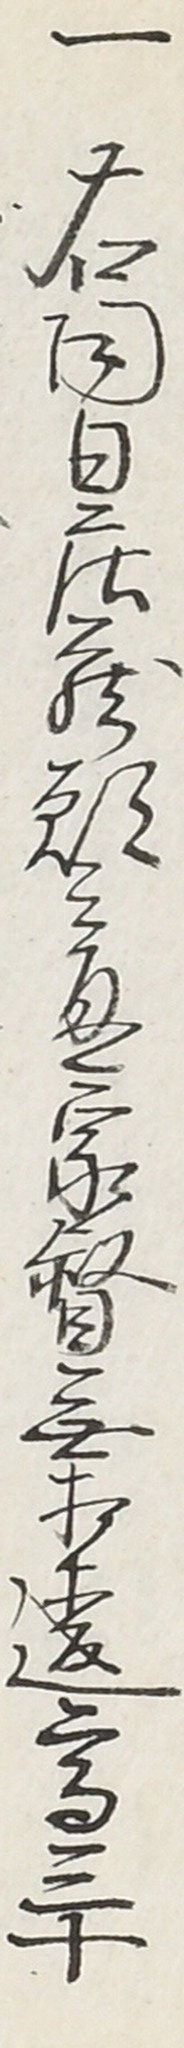一右同日庄蔵願之通家督無相違高三十
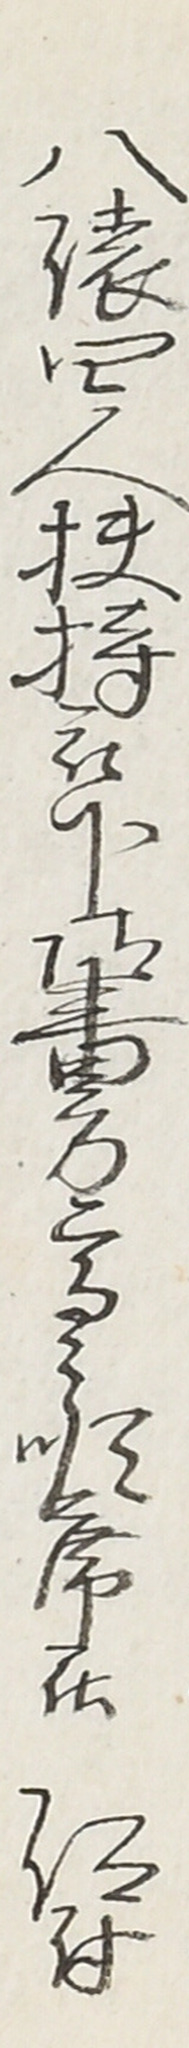八俵四人扶持被下御番方高之順席被仰付
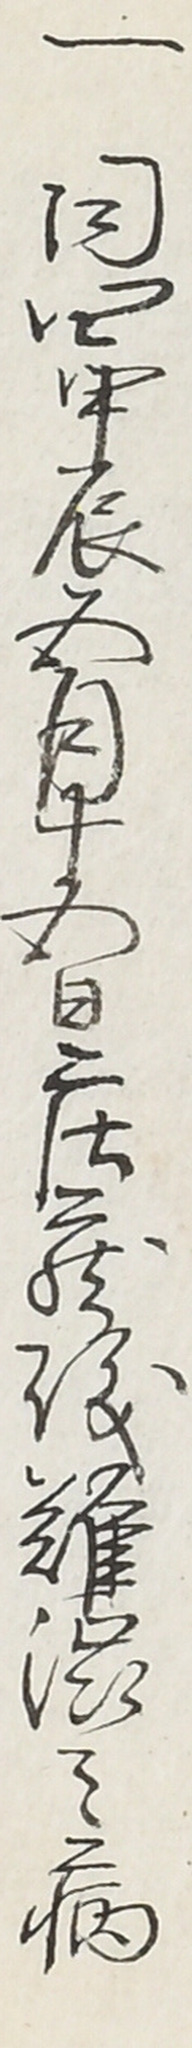一同四甲辰五月十五日庄蔵儀難渋之病
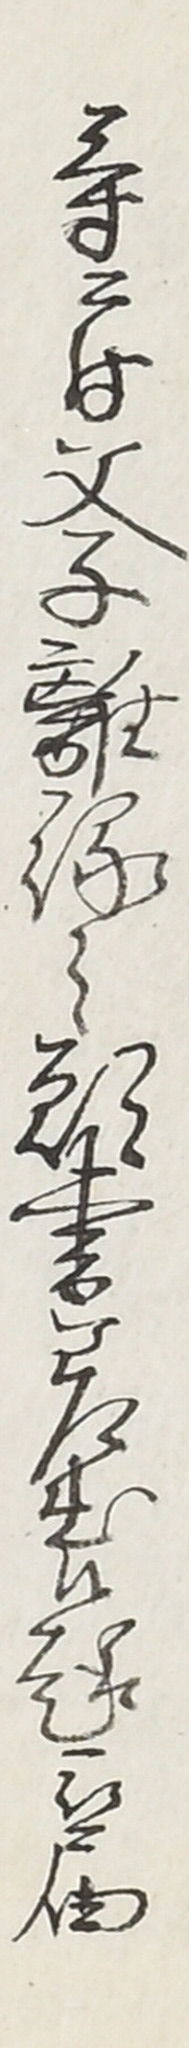気ニ付父子離縁之願書差出候趣被届
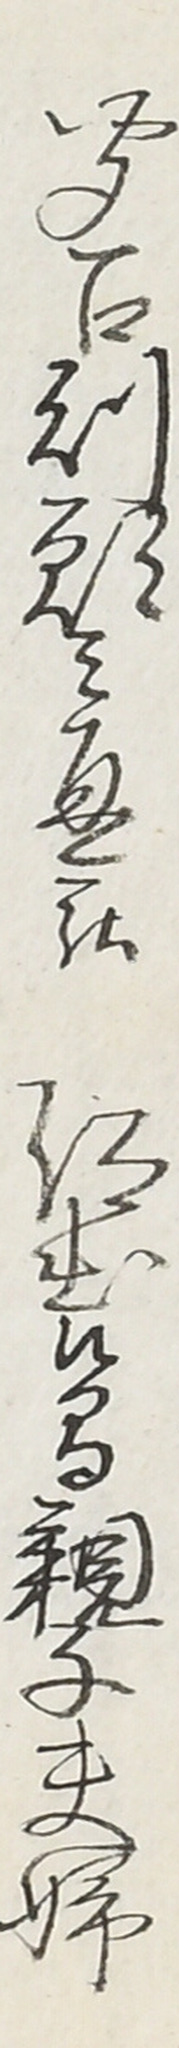聞召則願之通被仰出候間親子夫婦
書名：給人諸士勤仕録（七）
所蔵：伊那市立高遠町図書館・合同会社AMANE
